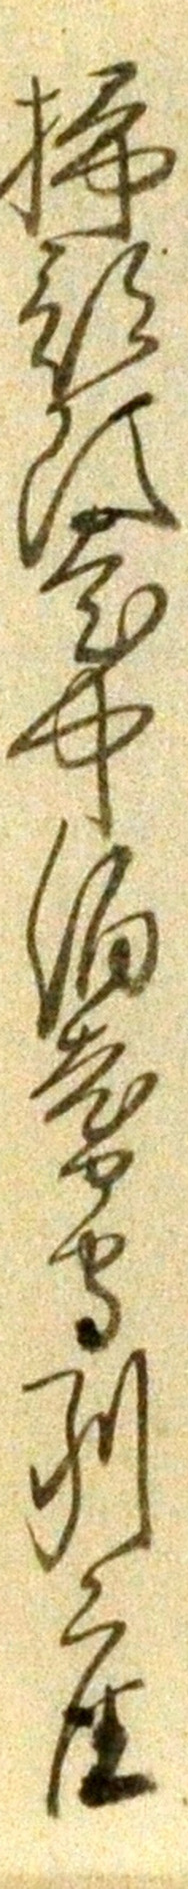掃部頭老中伯耆守列座
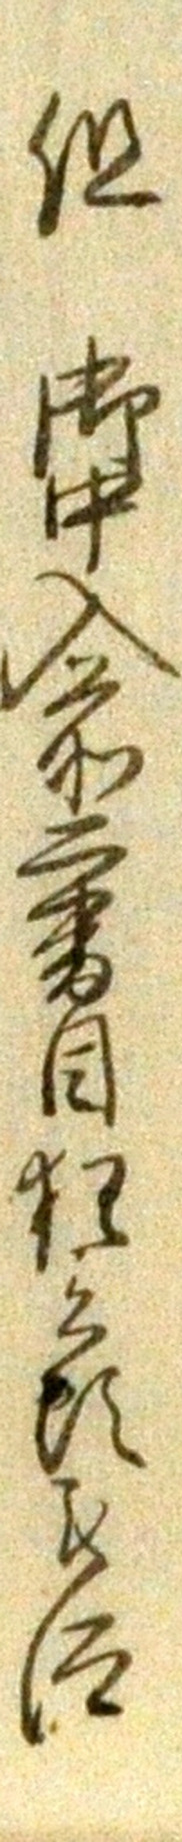但御中入前二番目狂言頃被仰
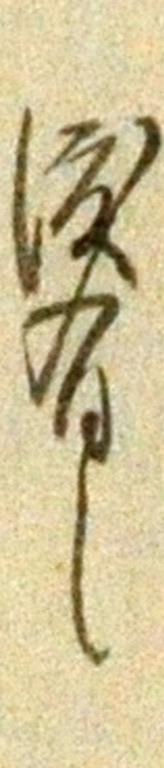渡有之
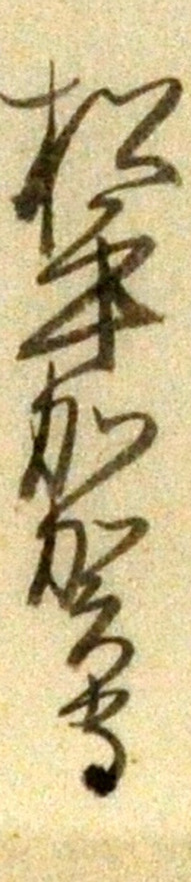松平加賀守
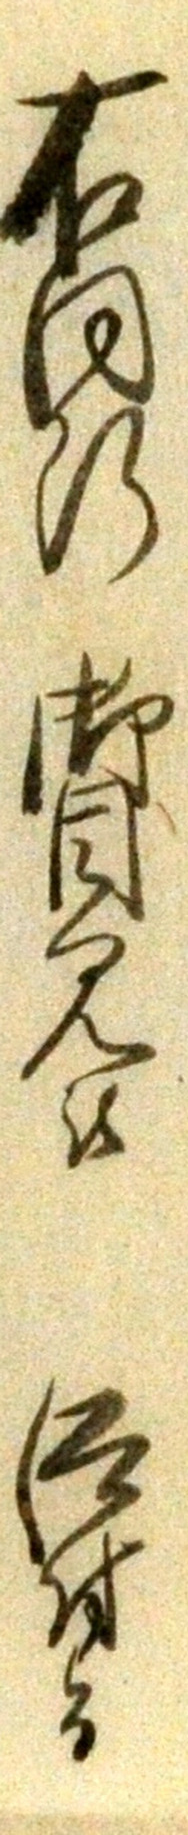右同断御目見被仰付旨
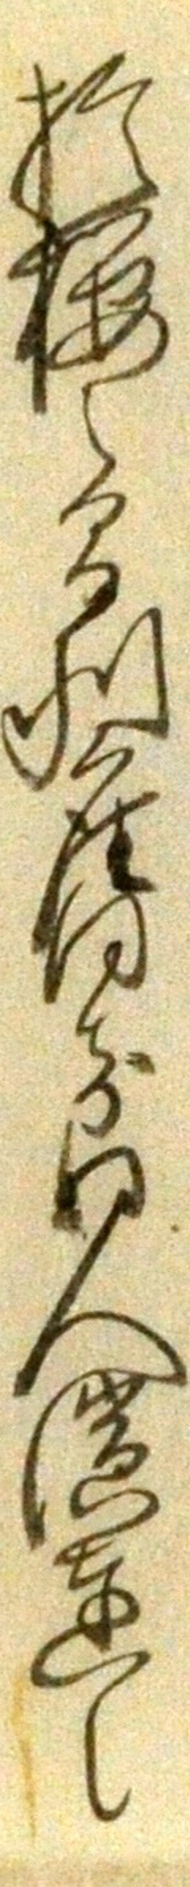於桜之間列座同前同人演達之
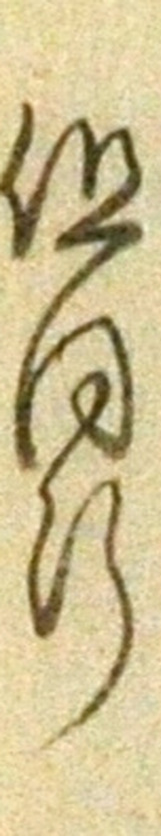但同断
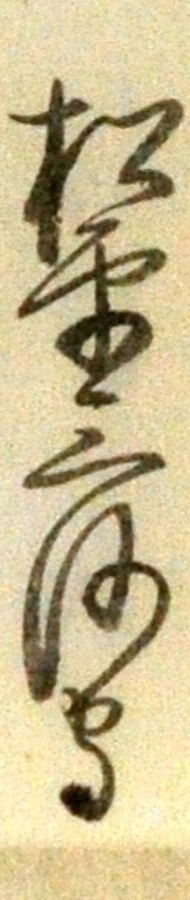松平三河守
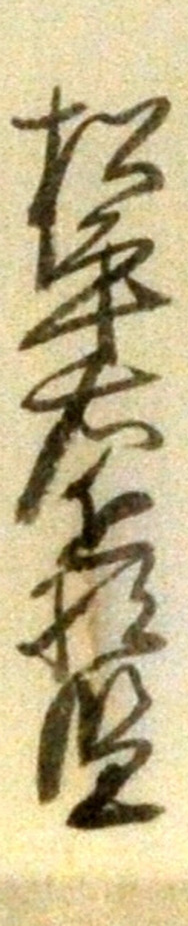松平右近将監
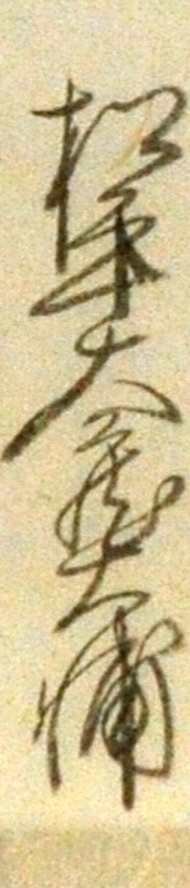松平大蔵大輔

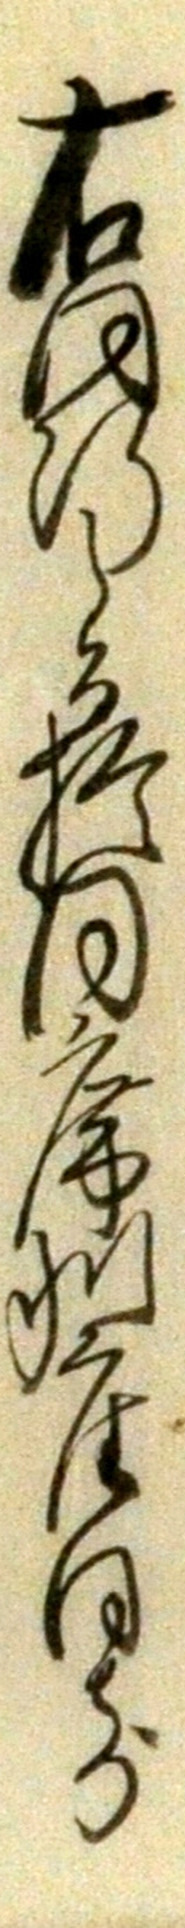右同断之旨於同席列座同前
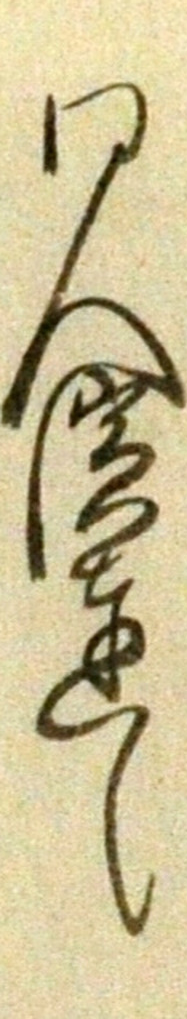同人演達之
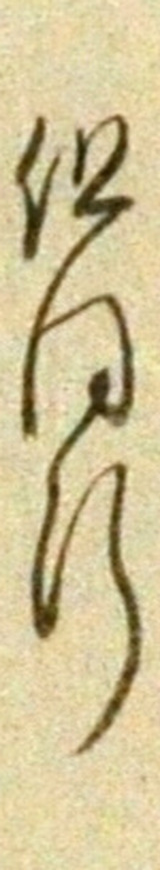但同断
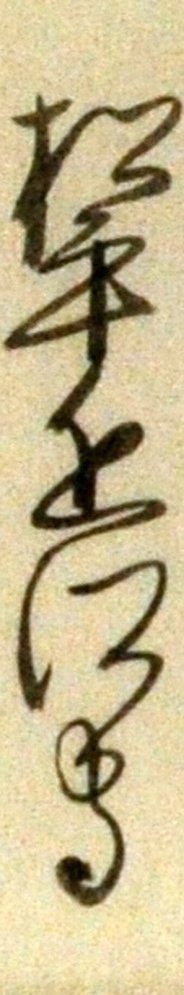松平近江守
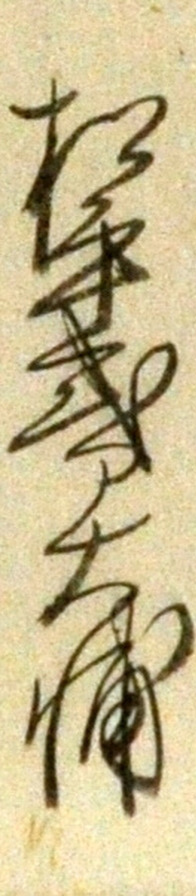松平式部大輔
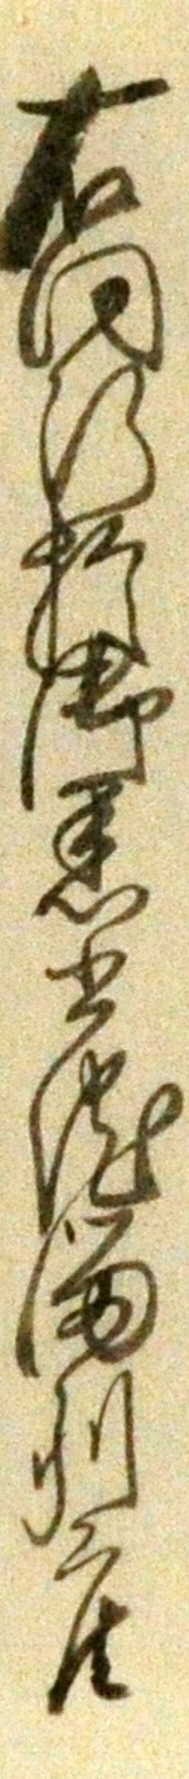右同断於御黒書院溜列座
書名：御馳走御能ノ節ノ留外
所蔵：伊那市立高遠町図書館・合同会社AMANE
